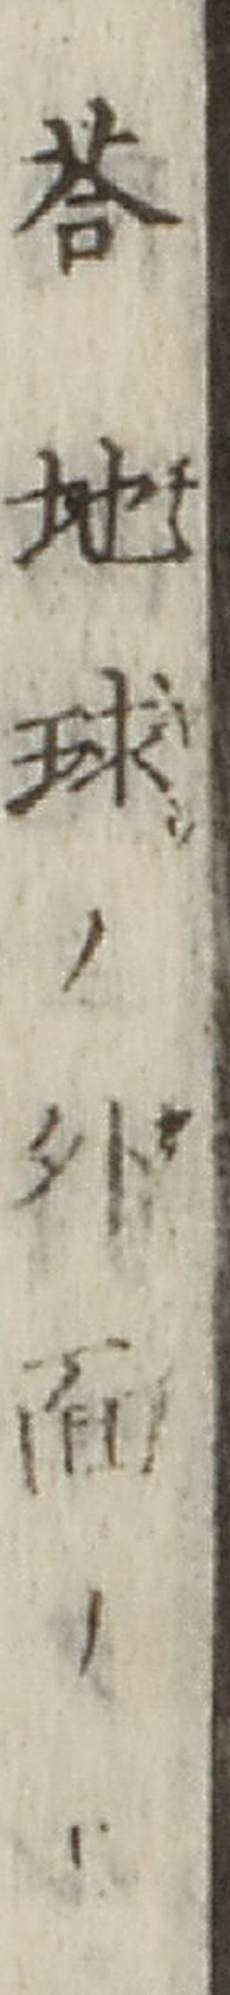答地球ノ外面ナリ
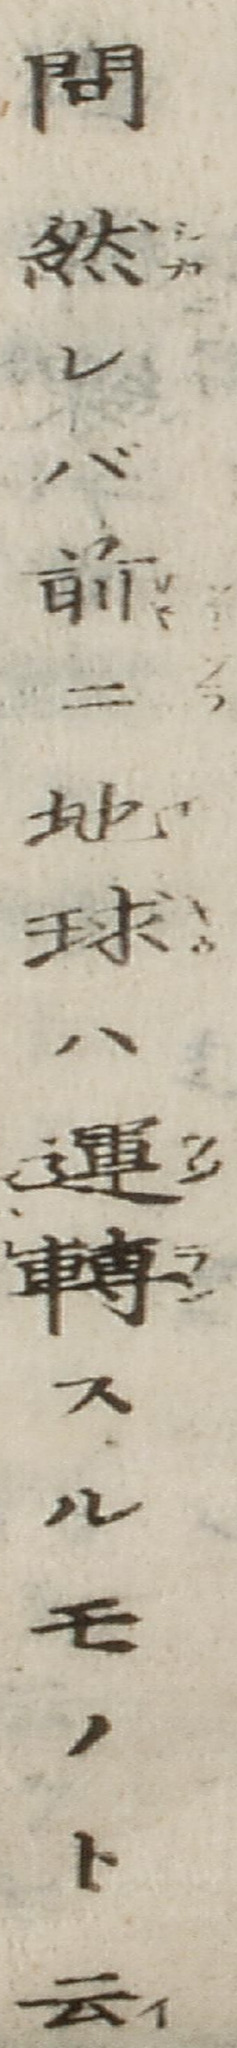問然レバ前ニ地球ハ運転スルモノト云
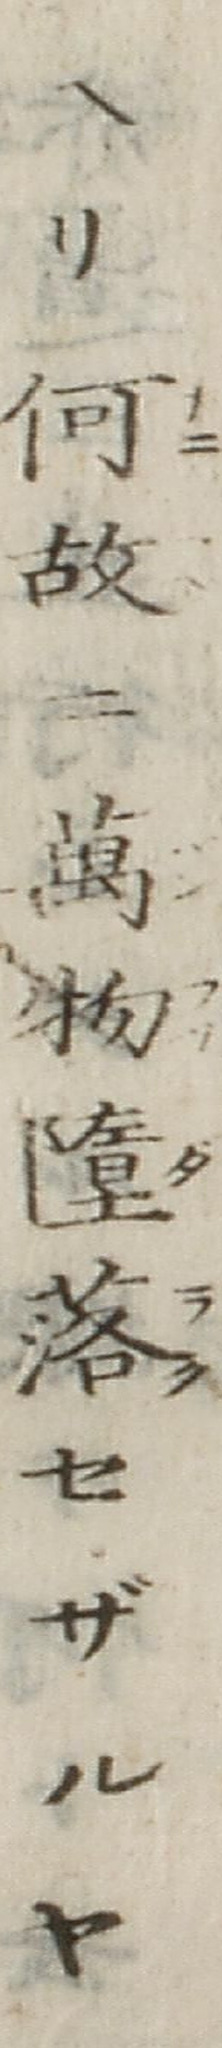へリ何故ニ万物堕落セザルヤ
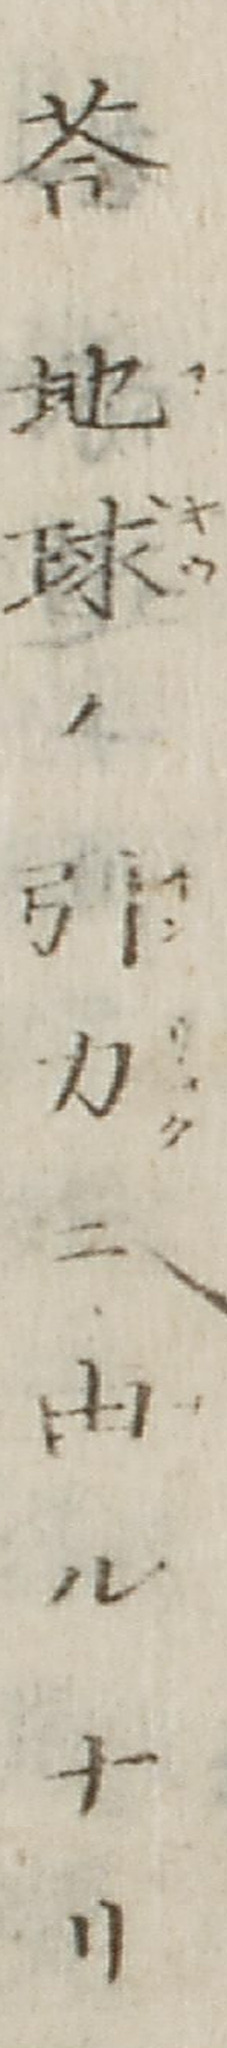答地球ノ引力ニ由ルナリ
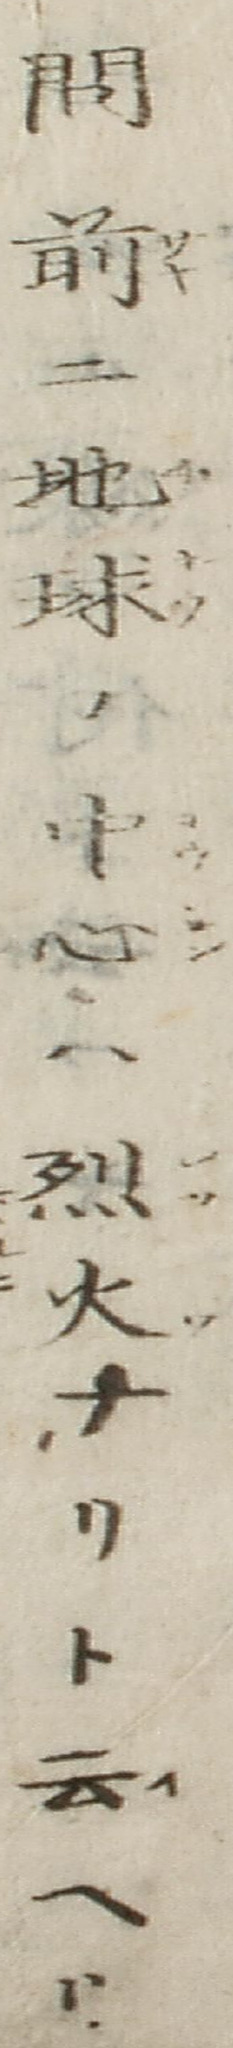問前ニ地球ノ中心ハ烈火ナリト云へト
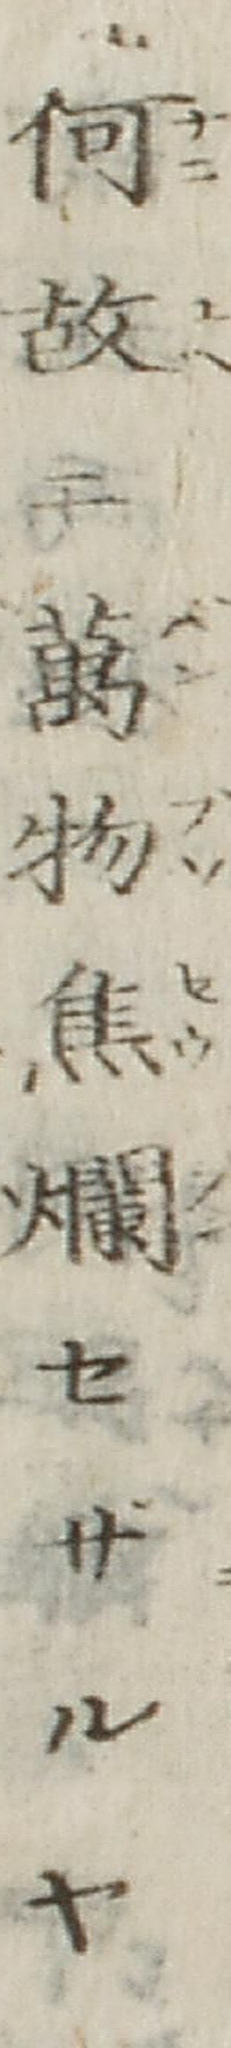何故ニ万物焦爛セサルヤ
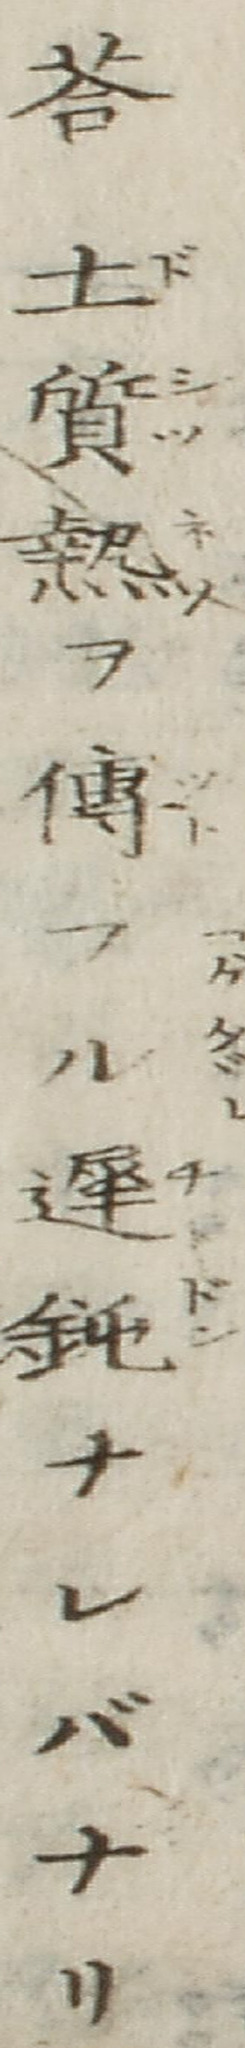答土質熱ヲ伝フル遅鈍ナレバナリ
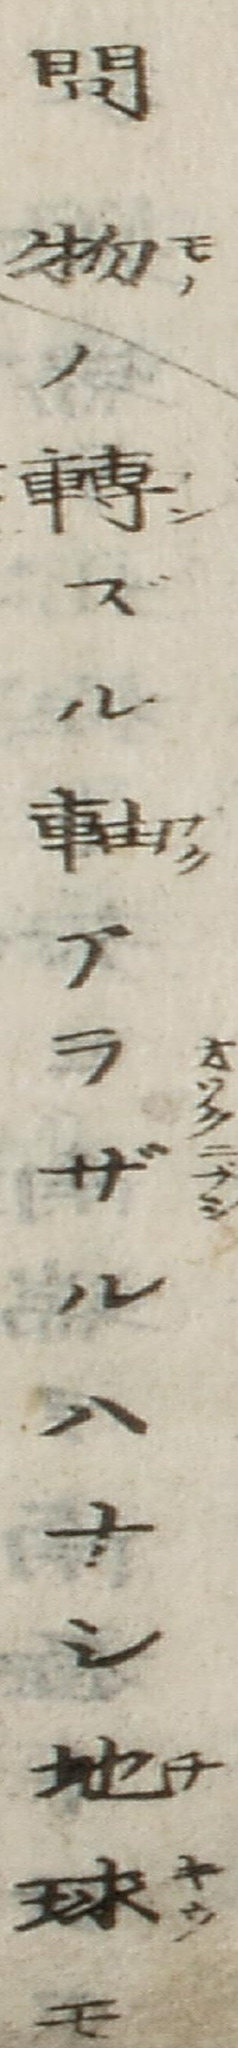問物ノ転ズル軸アラザルハナシ地球モ
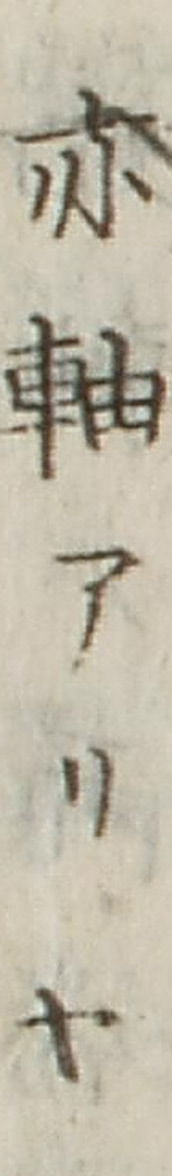亦軸アリヤ
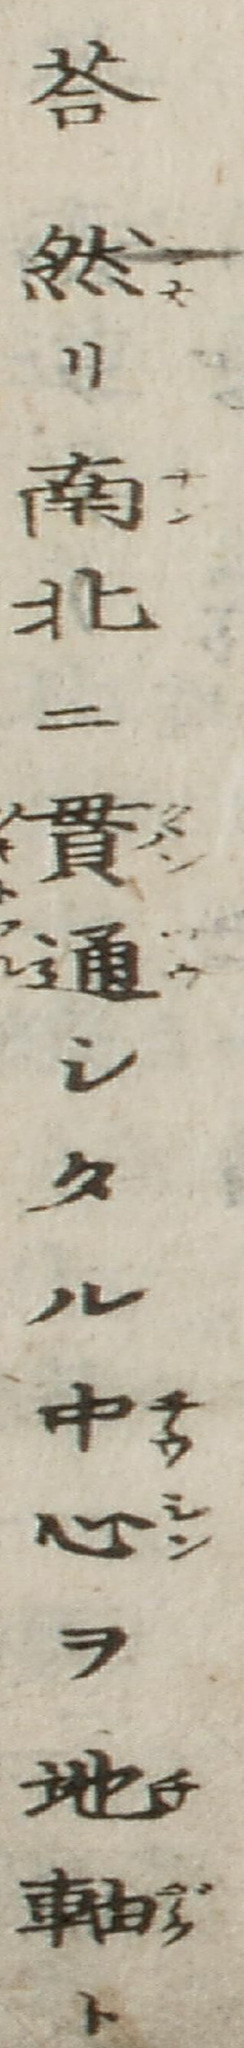答然リ南北ニ貫通シタル中心ヲ地軸ト

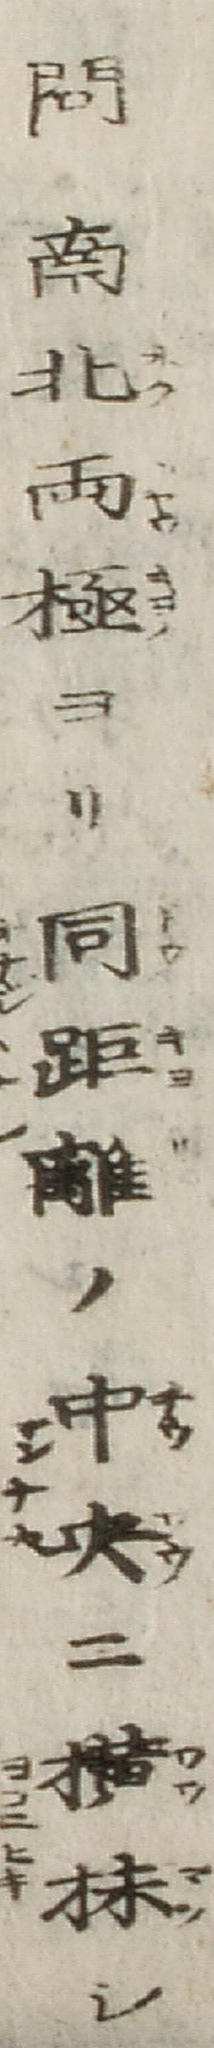問南北両極ヨリ同距離ノ中央ニ横抹シ
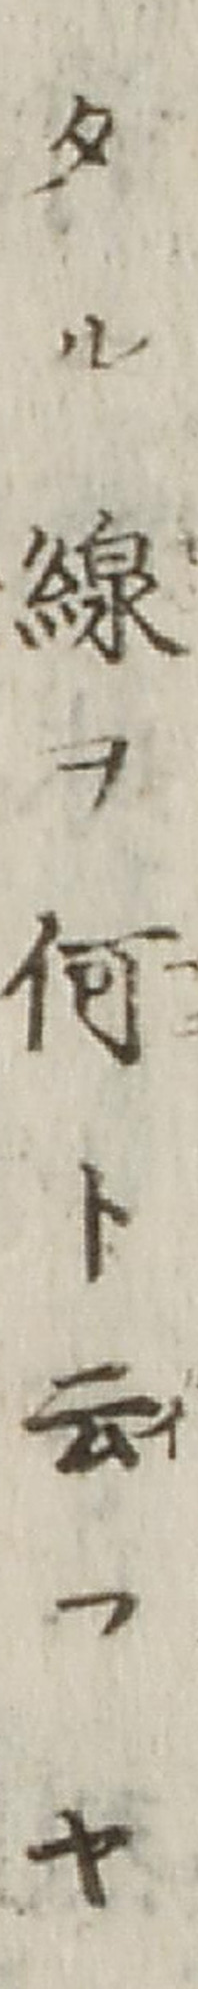タル線ヲ何ト云フヤ
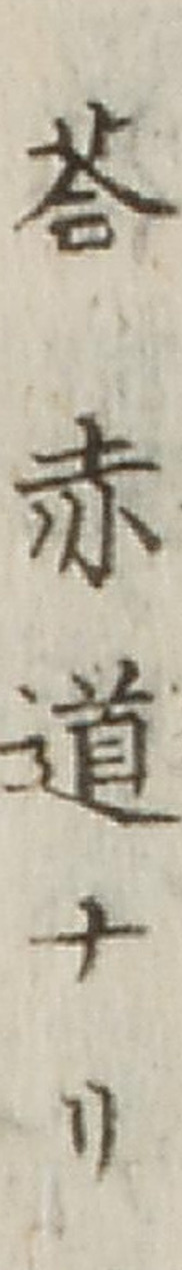答赤道ナリ
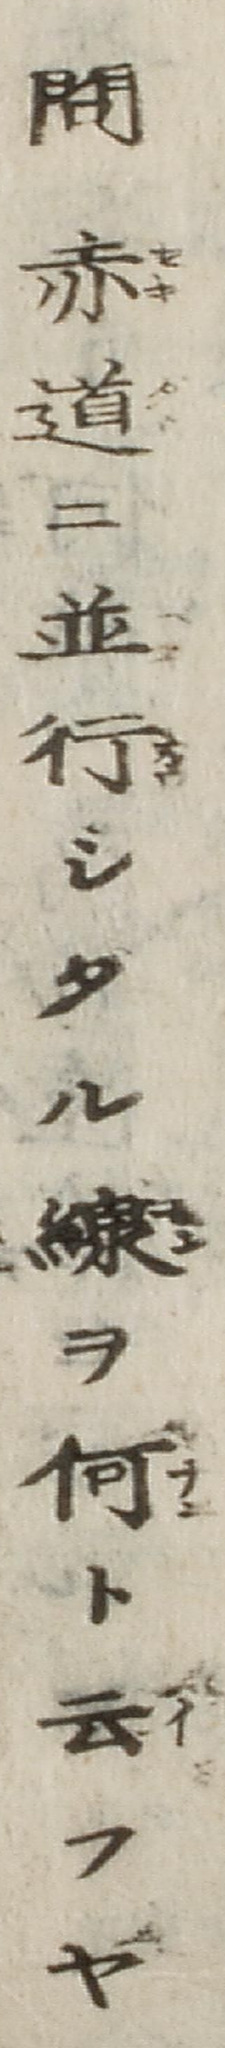問赤道ニ並行シタル線ヲ何ト云フヤ
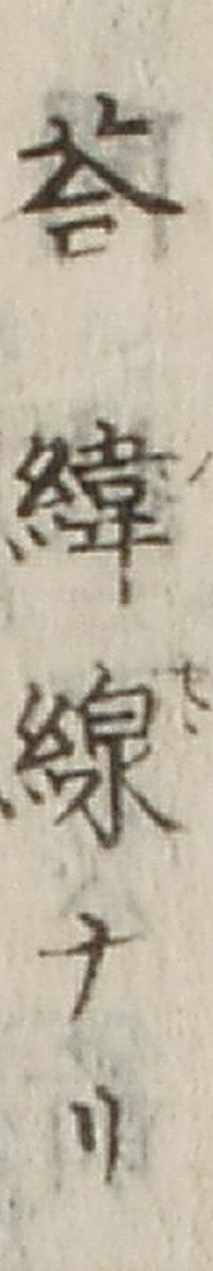答緯線ナリ
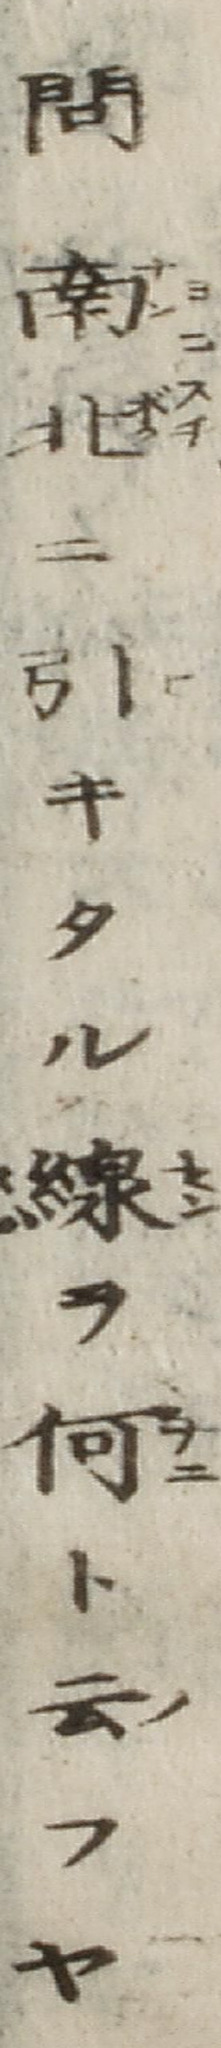問南北ニ引キタル線ヲ何ト云フヤ
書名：地球儀問答　全
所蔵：東京大学地震研究所図書室 Earthquake Research Institute Library, The University of Tokyo, JAPAN
